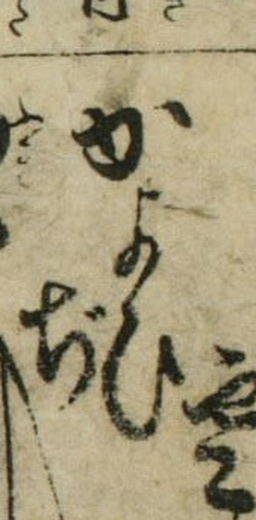かよひ
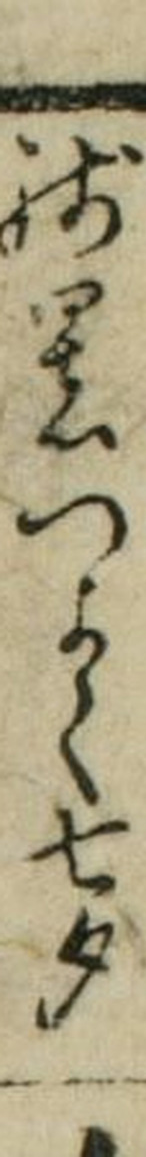残暑つよく七夕
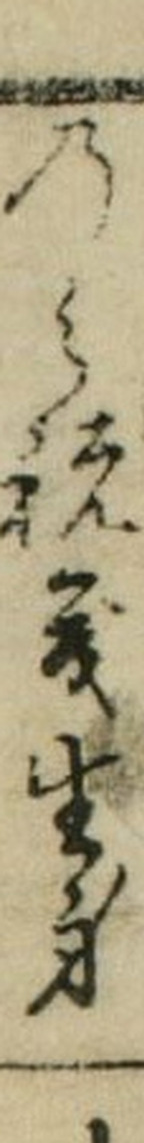の御祝義生身
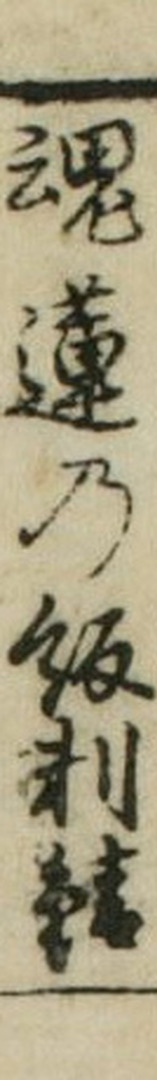魂蓮の飯刺鯖
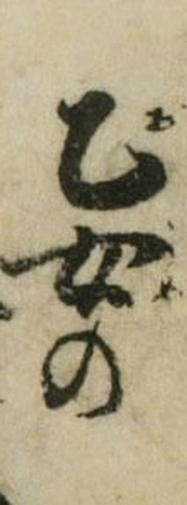乙女の
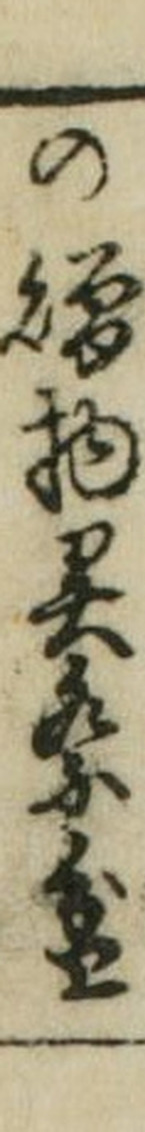の贈物霊祭盆
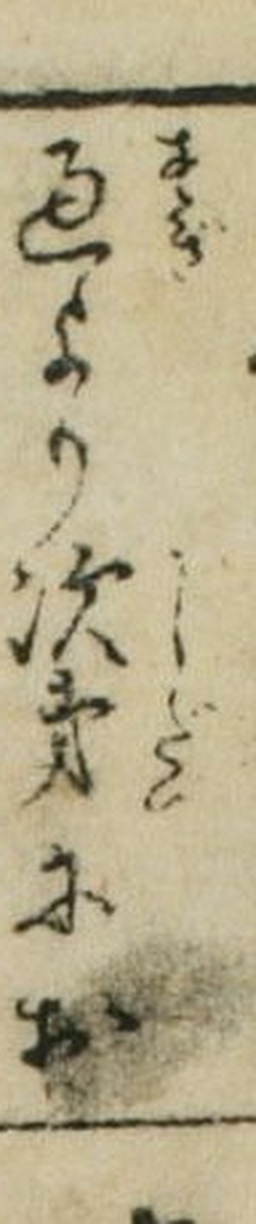過より次第にお
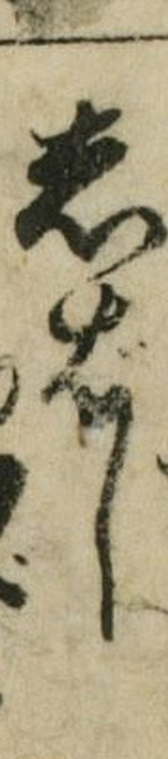しばし
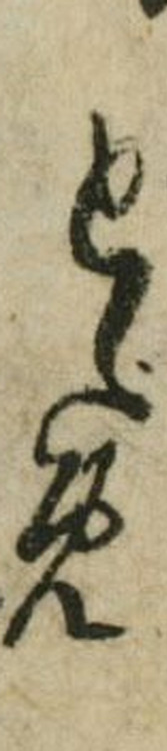とゞめ
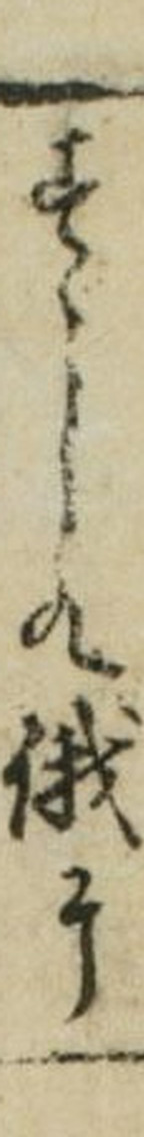すゞしく俄に
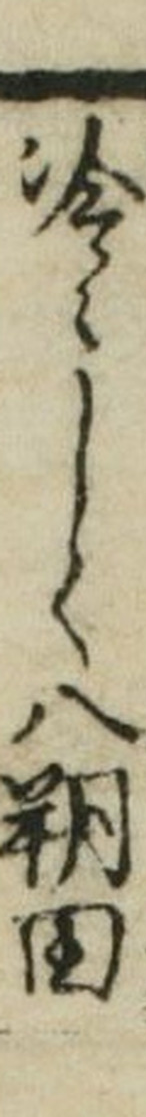冷々しく八朔田
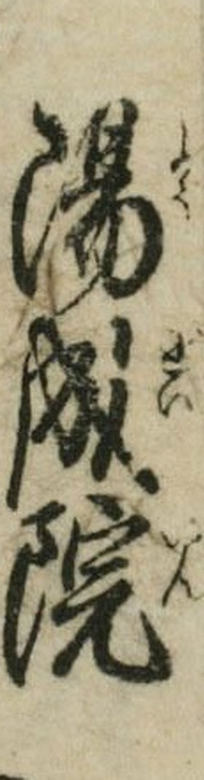陽成院
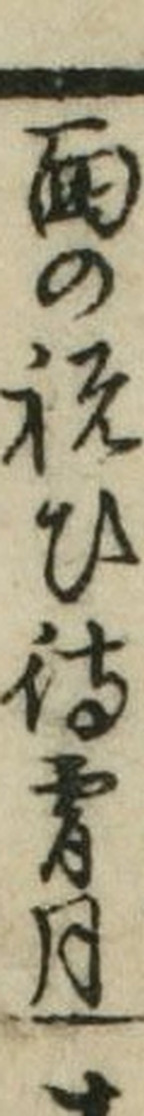面の祝ひ待宵月
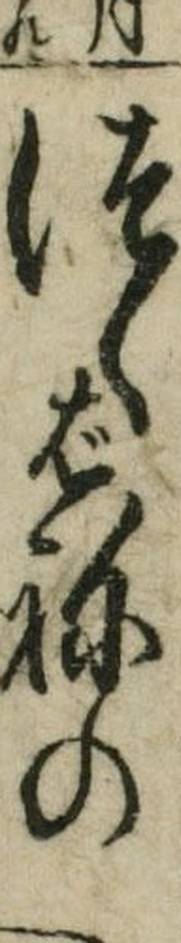つくばねの
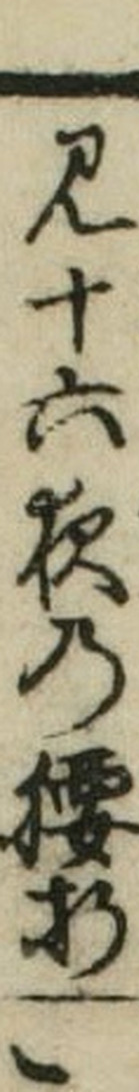見十六夜の腰折
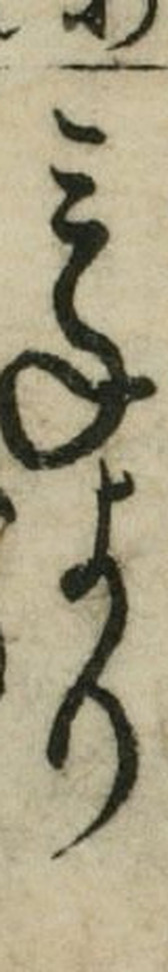みねより
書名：百人一首
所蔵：東京学芸大学教育コンテンツアーカイブ
